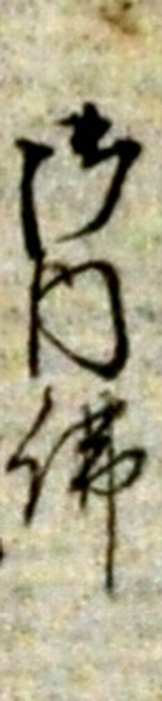御門仏
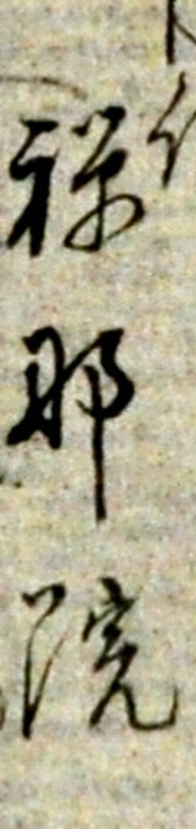禅師院
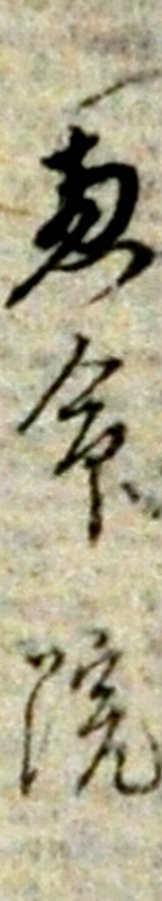恵命院
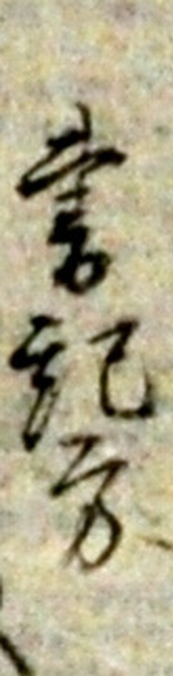書記方
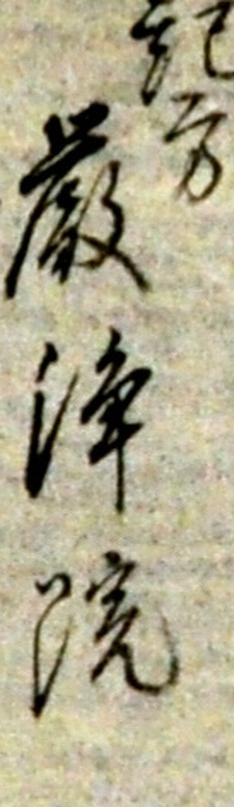厳浄院
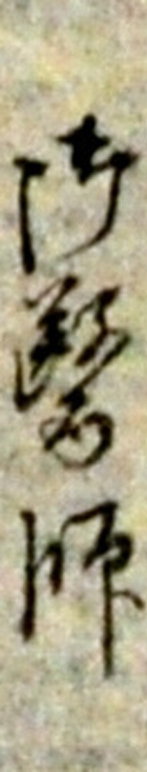御医師
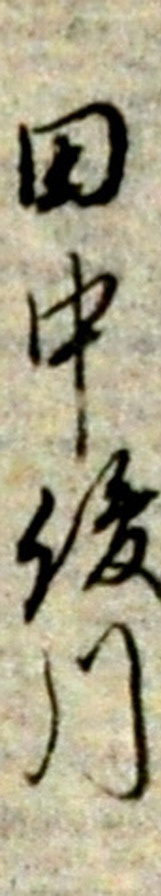田中俊川
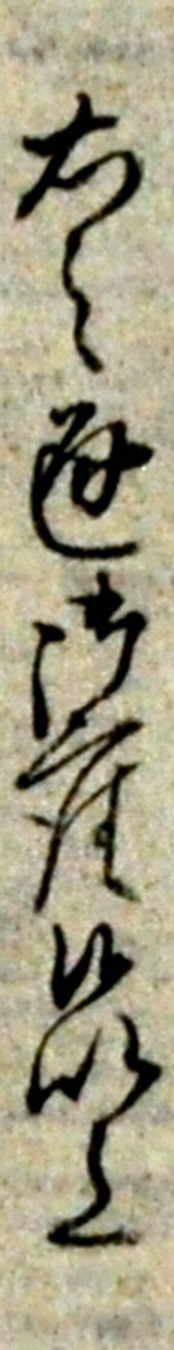右之通御座候以上

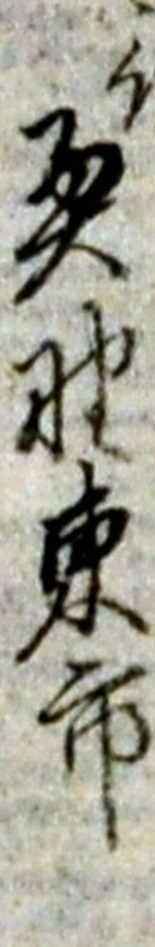奥野東市
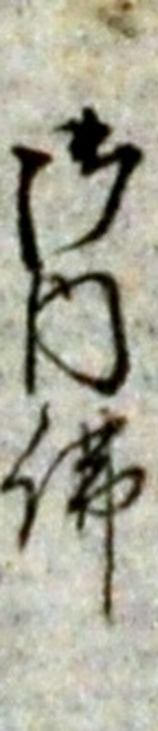御内仏
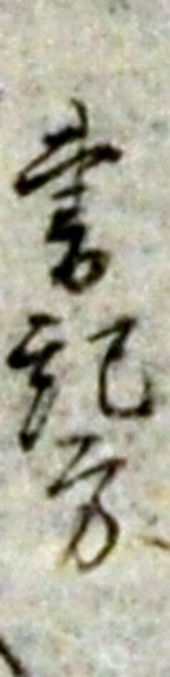書記方
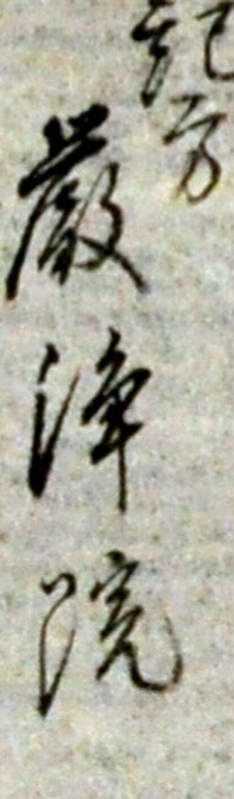厳浄院
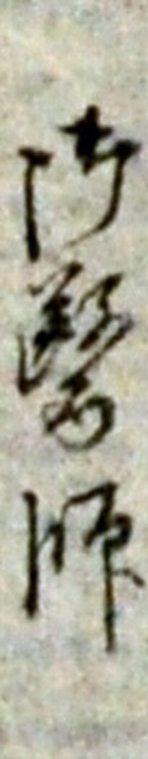御医師
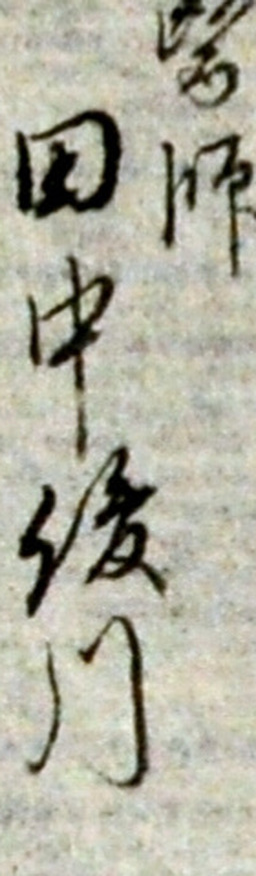田中俊川
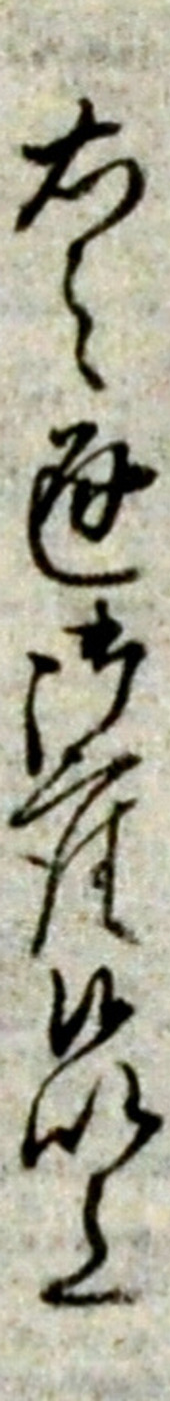右之通御座候以上
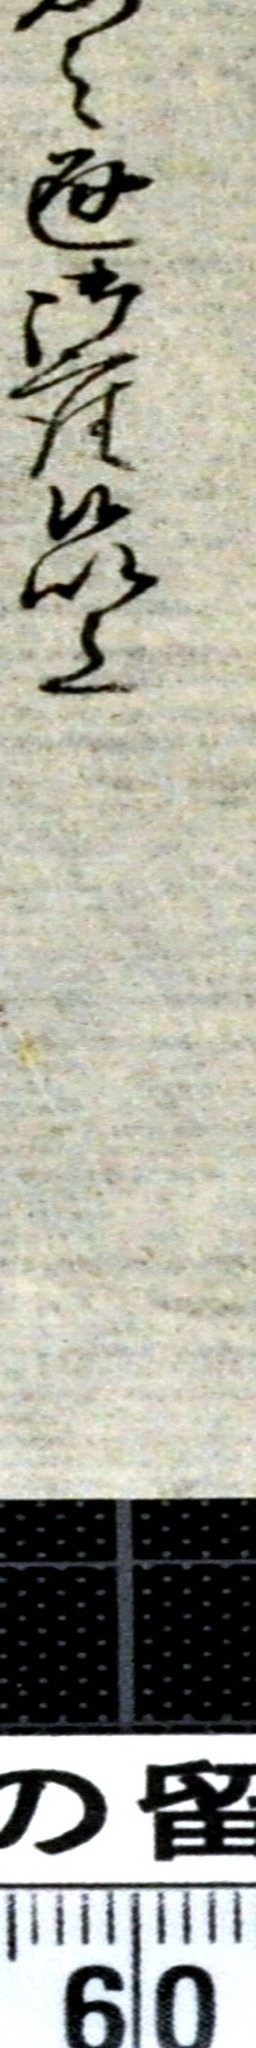右之通御座候以上
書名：日光御名代相勤候節ノ留
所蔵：伊那市立高遠町図書館・合同会社AMANE
